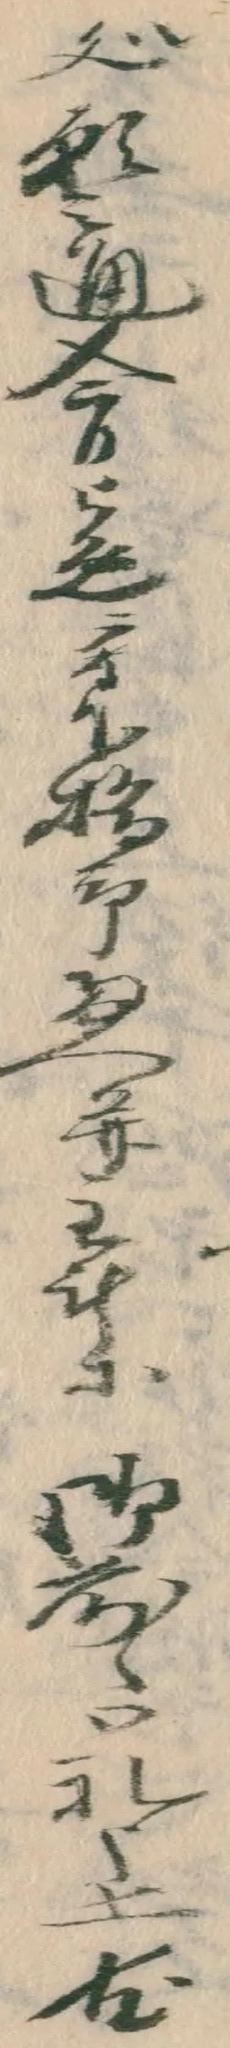処願之通入旨被免ニ付下橋予両人幷主斗等御前へ御礼申上尤
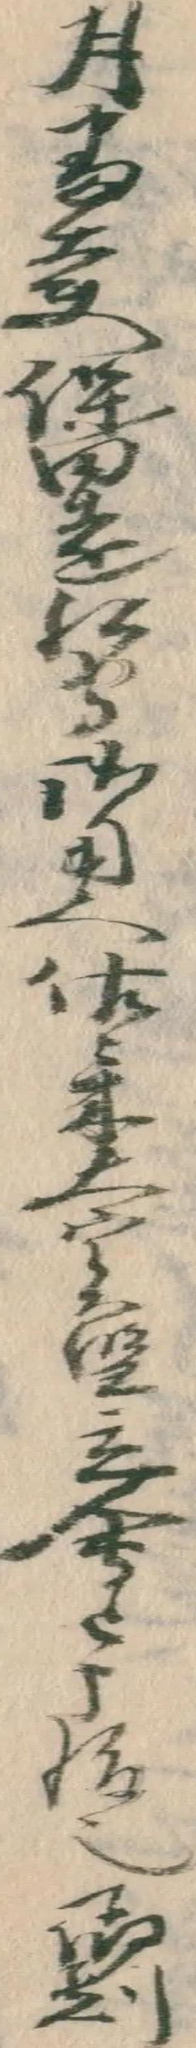月番大夫保田遠江守御用人佐々木太宰大監立會被申渡也即刻
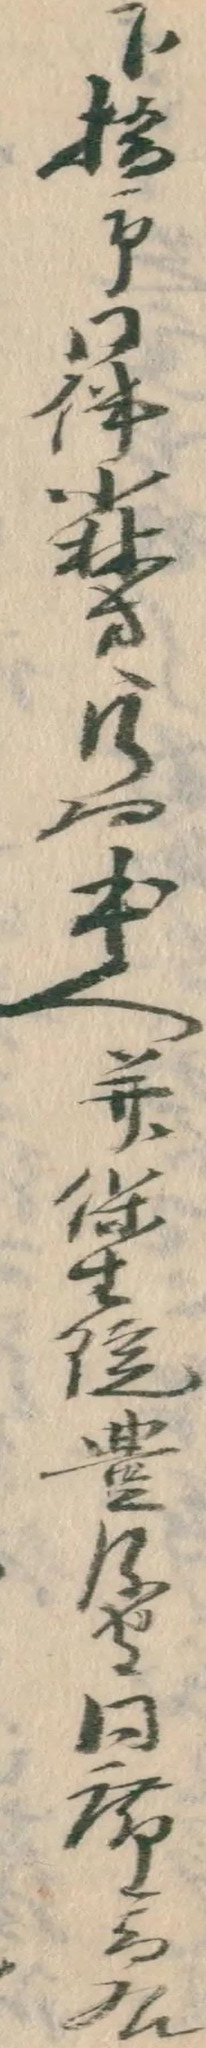下橋予同伴小林方へ引向本人幷保生徒豊後守同席ニ而右
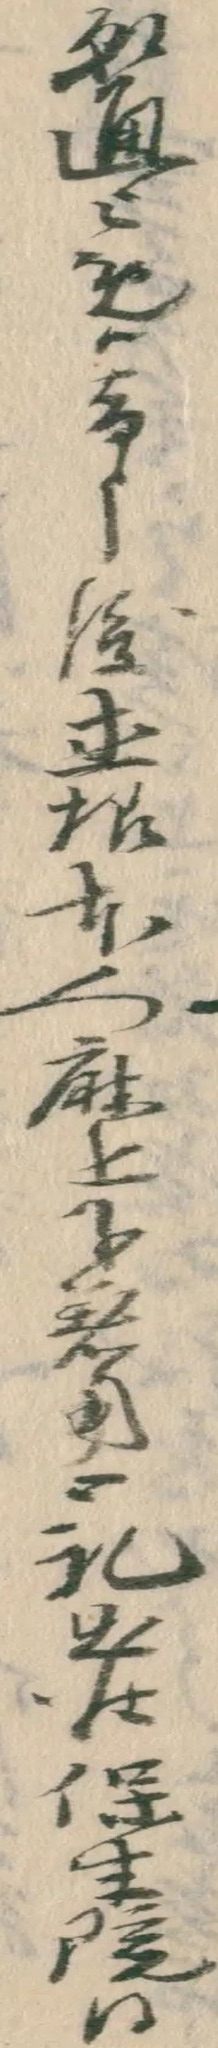願通被免候旨申後直様本人麻上下着用御礼出仕保生院同
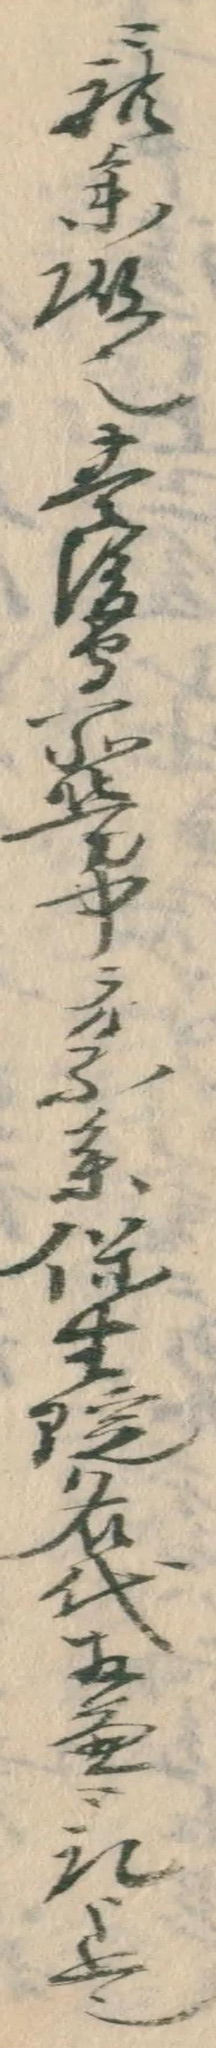披参殿也豊後守所中ニ付不参保生院名代相兼御礼申上之
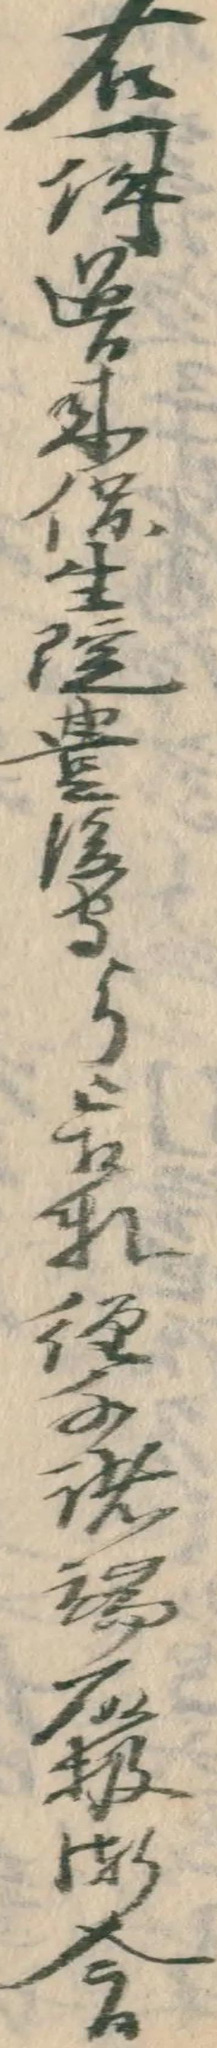右一件過日来保生院豊後守より被相頼経千諸端取扱漸今日
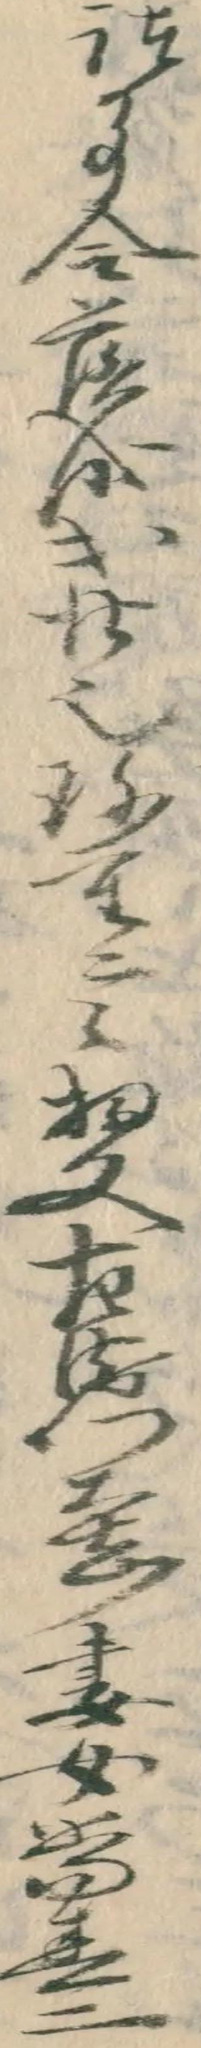諸事令落成出仕也珍重々々扨又左衛門大志妻女當春二
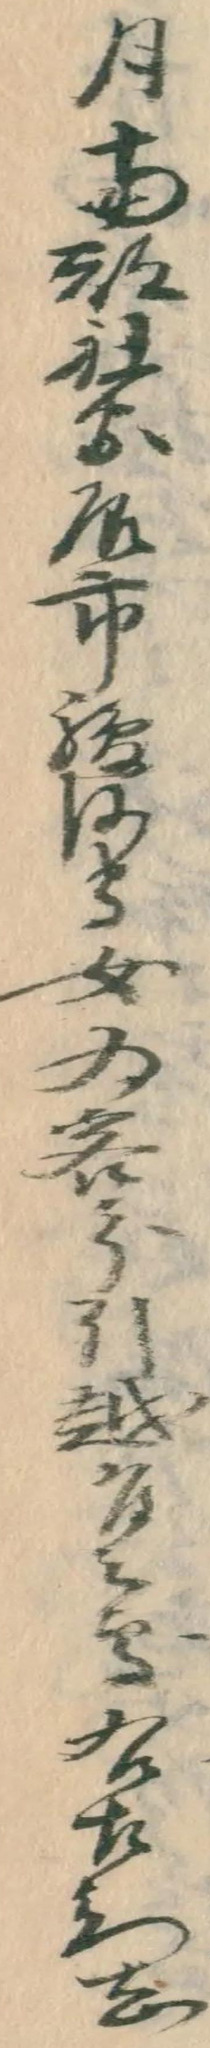月両願社家辰市駿河守女為客分引越有之處右左衛門甚

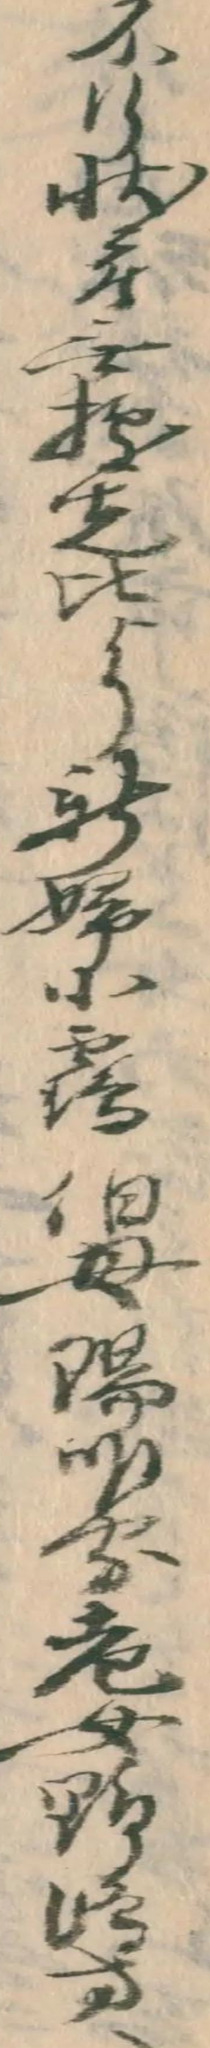不行状ニ付無拠先比より新婦小鶴伯母陽明家老女野嶋方へ
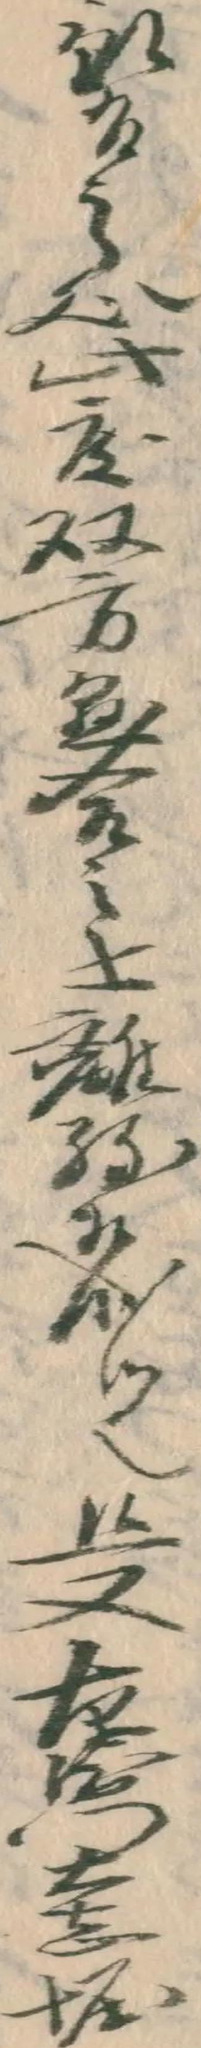願有之処此度双方懸合之上離縁相成候也且又左衛門大志堀
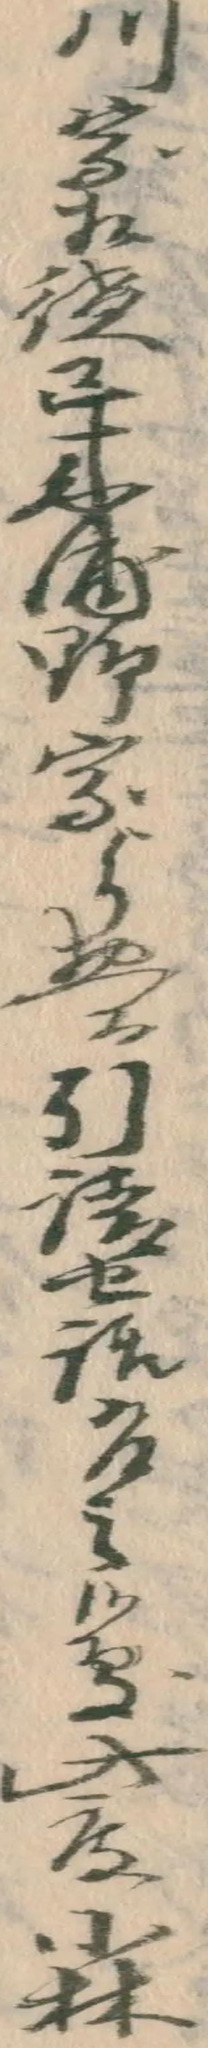川家相續已来浦野家より惣而引請世話有之候処此度小林
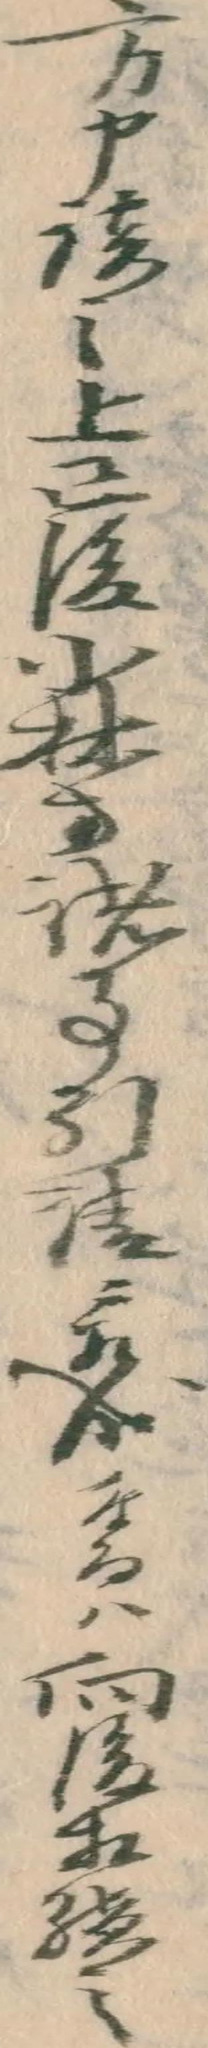方申談之上已後小林方諸事引請ニ相成付而ハ向後相續之
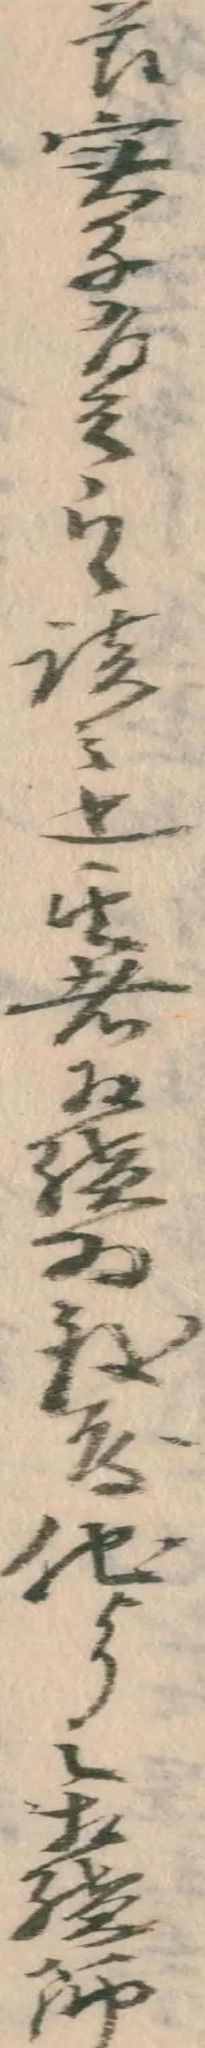節実子有之候ハヽ談之上其者相續為致度他より之相續節
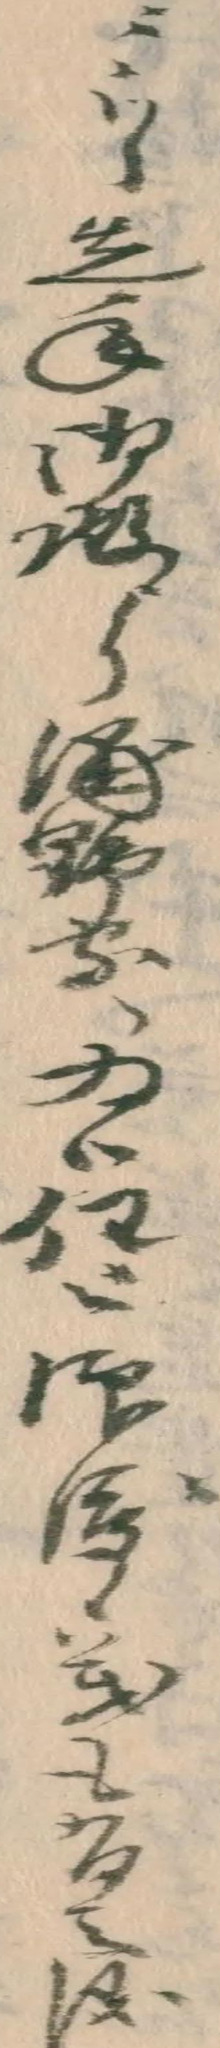候ハヽ先年御殿より浦野家へ為御任被仰渡候義も有之儀
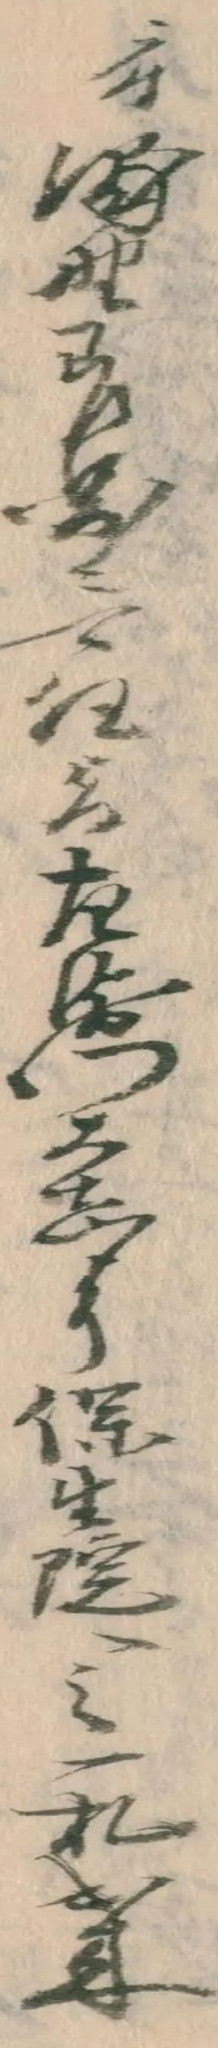ニ付浦野差図ニ可任旨左衛門大志より保生院へ之一札出来
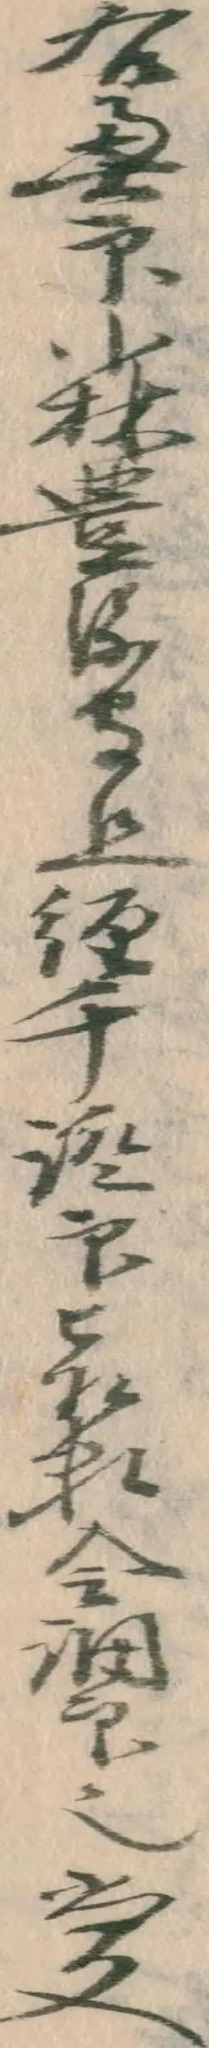右奥印小林豊後守且経千證印被相頼令調印也尚又
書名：賀茂社記録. 第69冊
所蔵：国立国会図書館 National Diet Library, JAPAN
